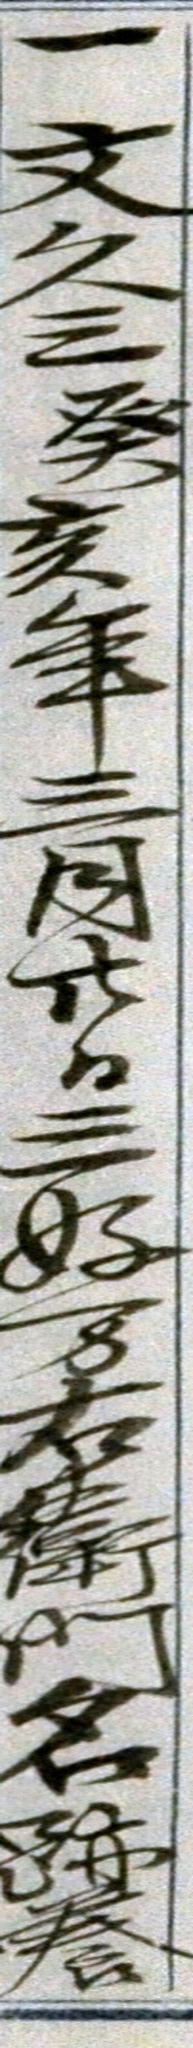一文久三癸亥年三月廿日三好万右衛門名跡養
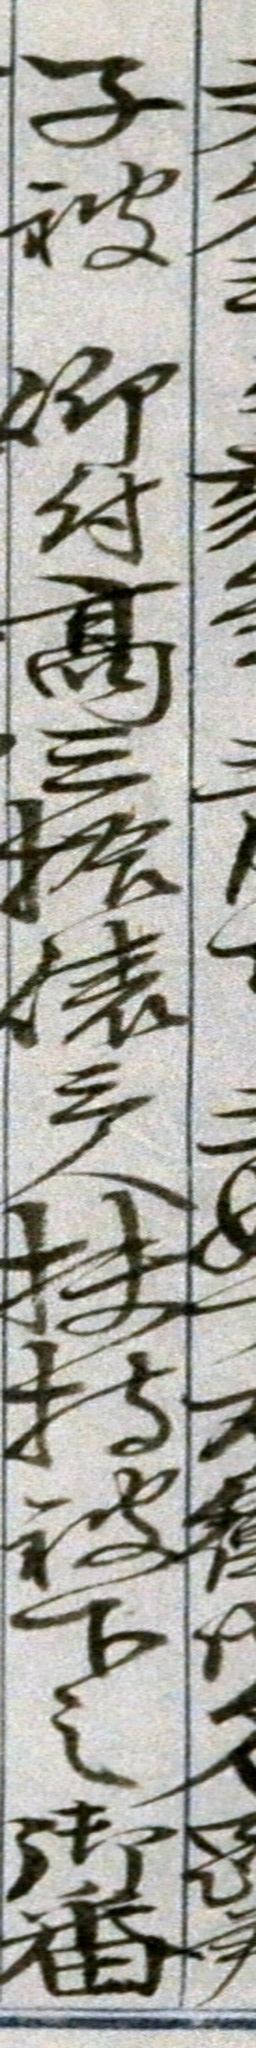子被仰付高三拾俵三人扶持被下之御番
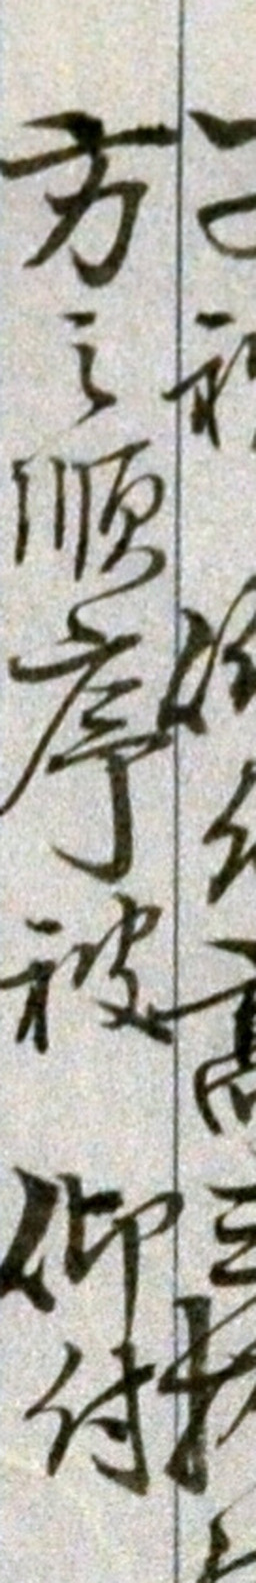方之順序被仰付
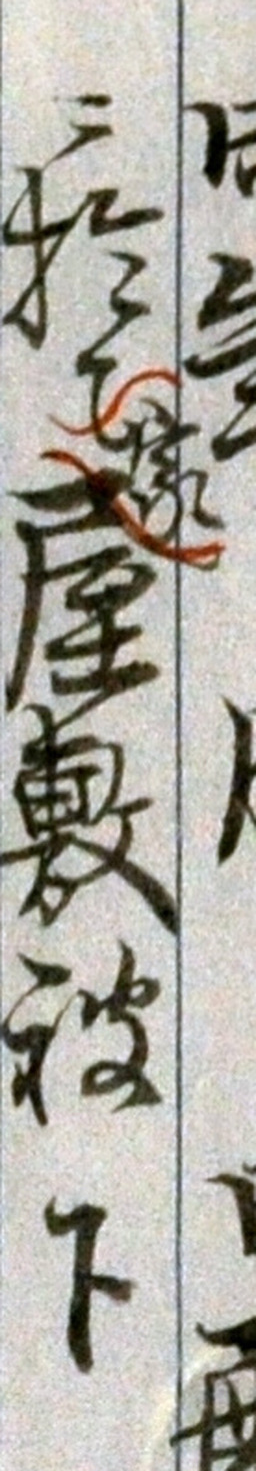ニ於て家屋敷被下
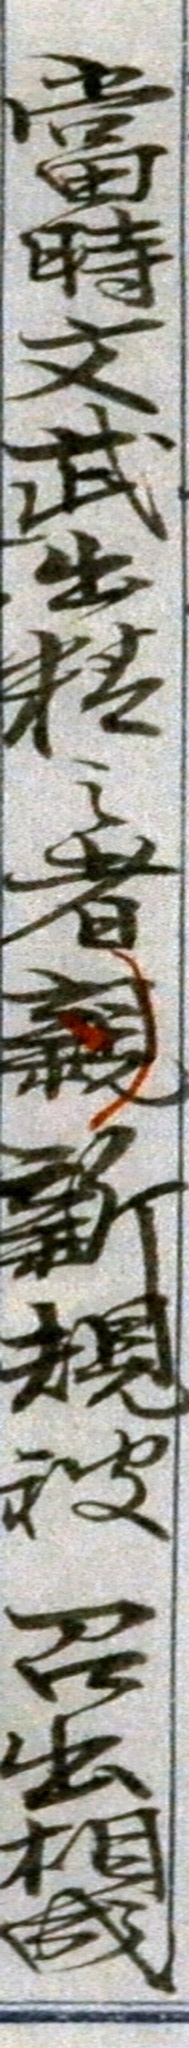当時文武出精之者新規被召出相成
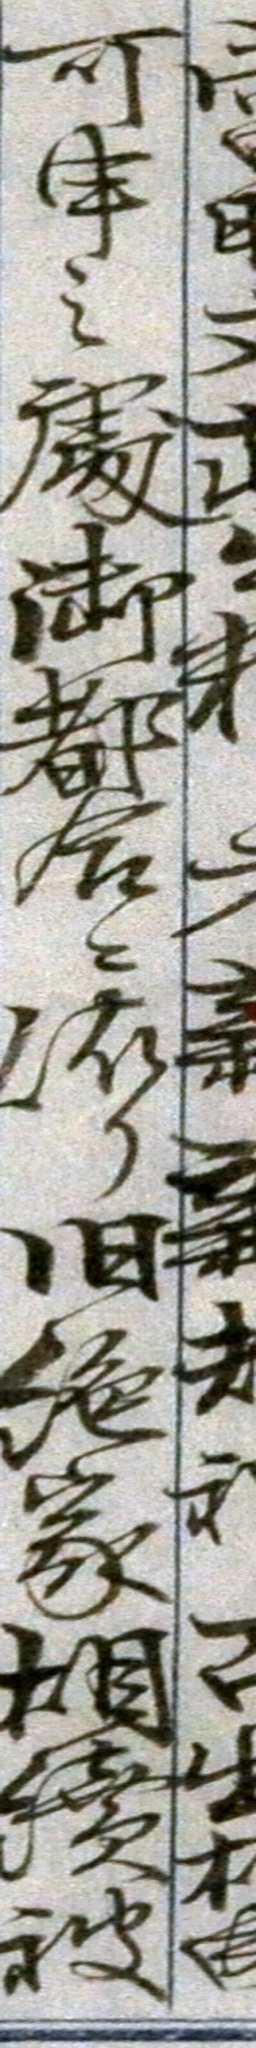可申之処御都合ニ依り旧絶家相続被
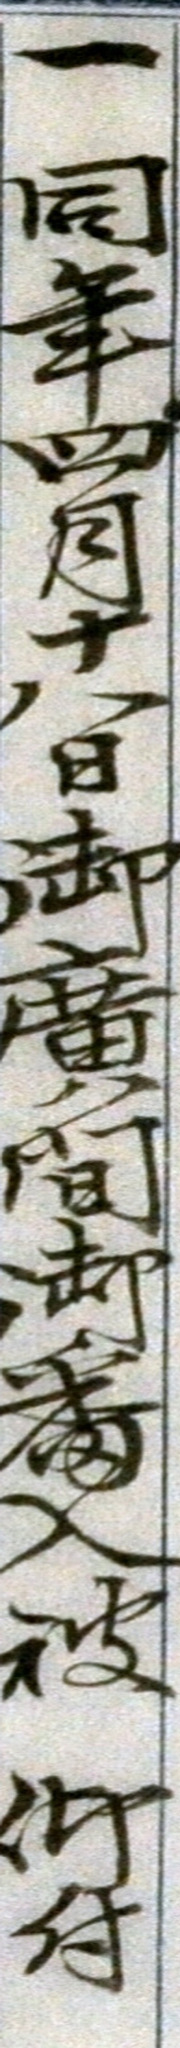一同年四月十八日御広間御番入被仰付
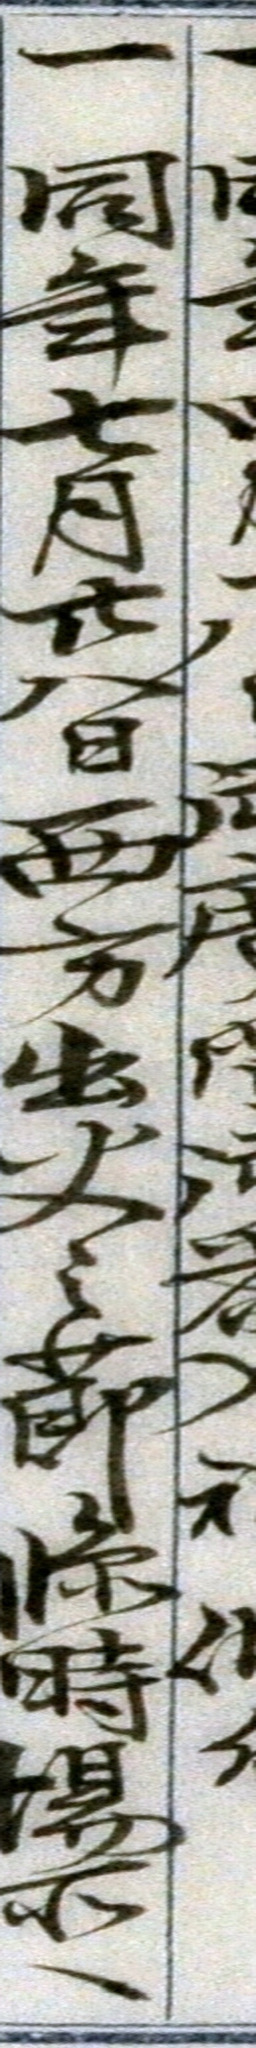一同年七月廿八日西方出火之節臨時場所へ
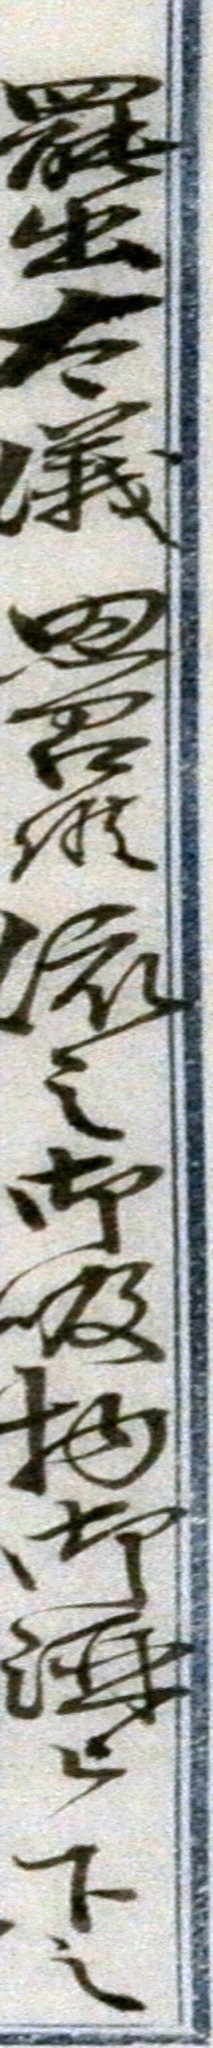罷出太儀思召候依之御吸物御酒被下之
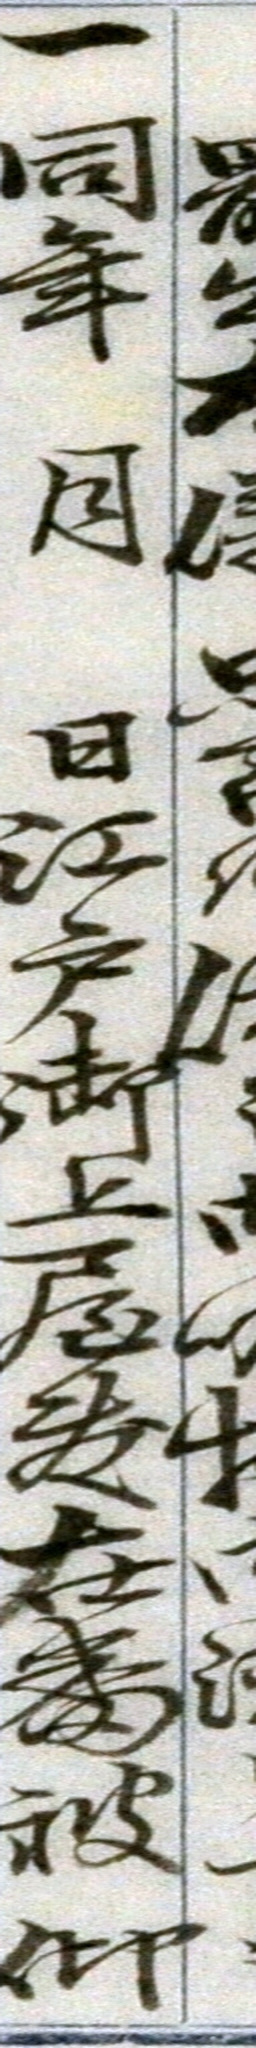一同年月日江戸御上屋敷在番被仰
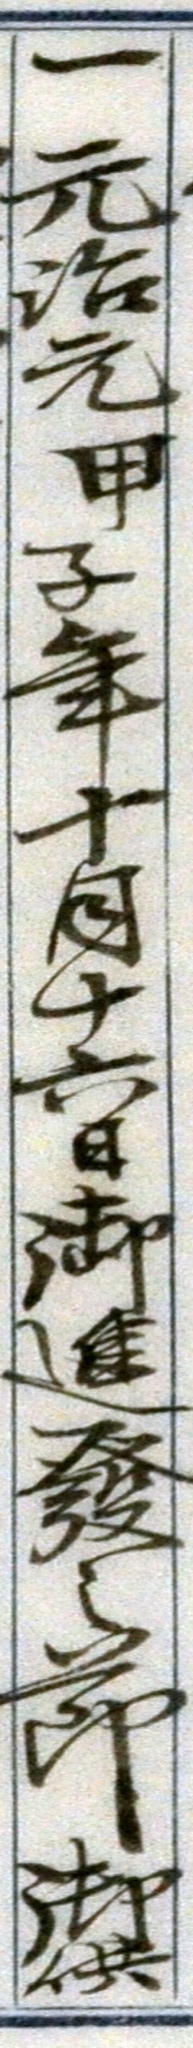一元治元甲子年十月十六日御進発之節御供
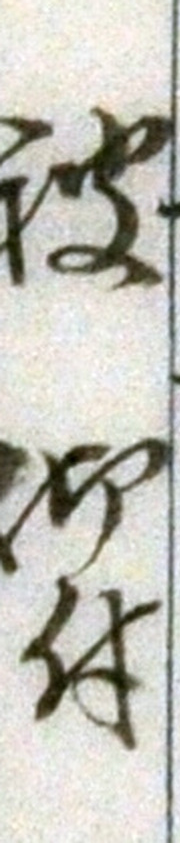被仰付
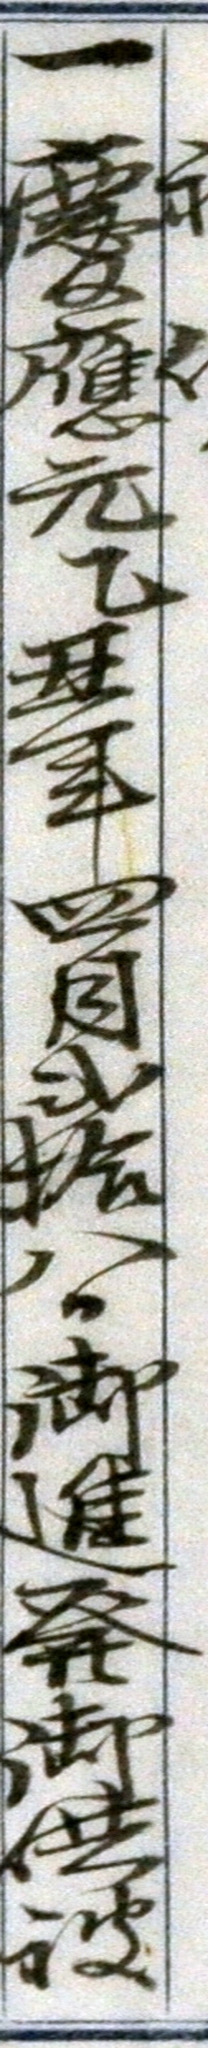一慶應元乙丑年四月弐拾八日御進発御供被
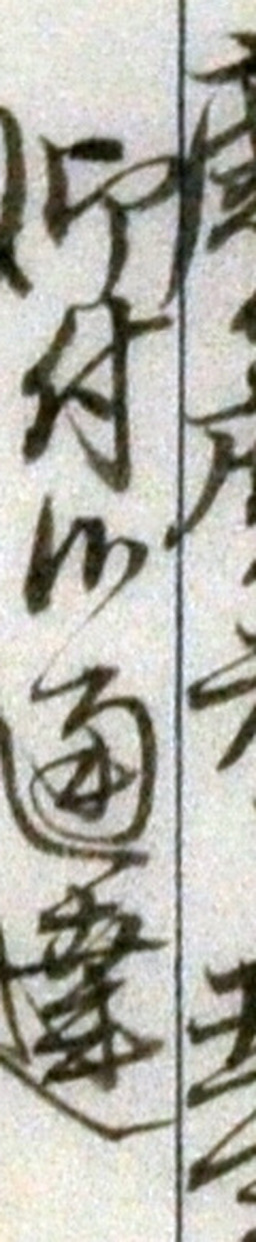仰付候通達
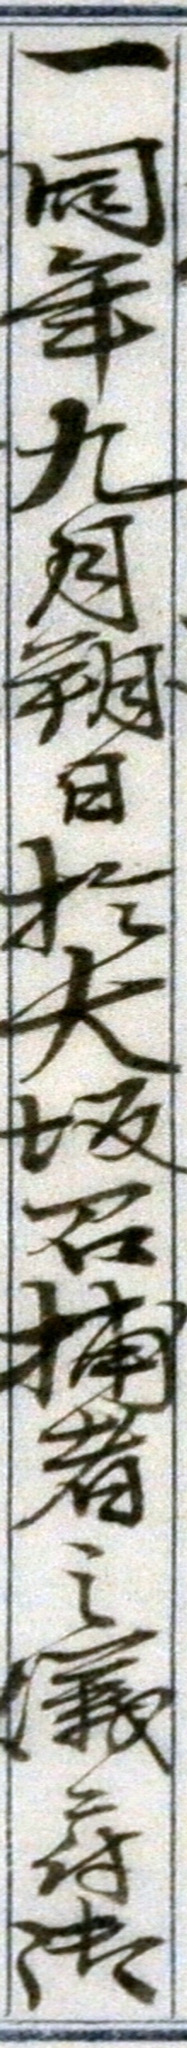一同年九月朔日於大坂召捕者之儀ニ付御
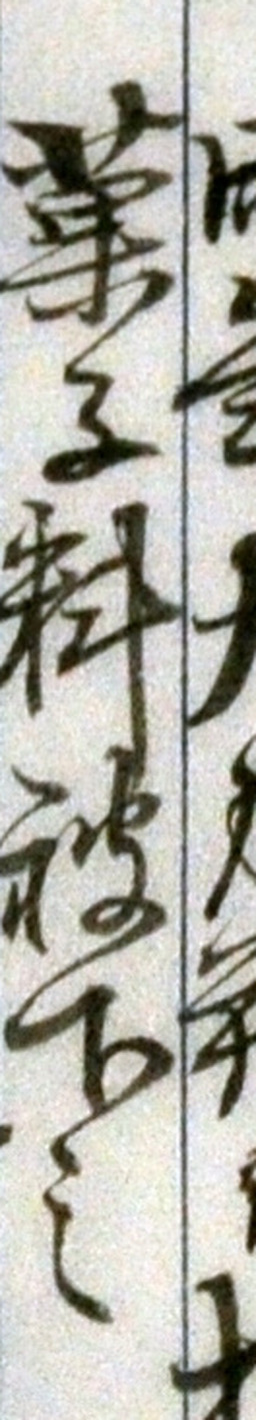菓子料被下之
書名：三好氏先代以来勤仕録、池田丈介一家勤仕録
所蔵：伊那市立高遠町図書館・合同会社AMANE
